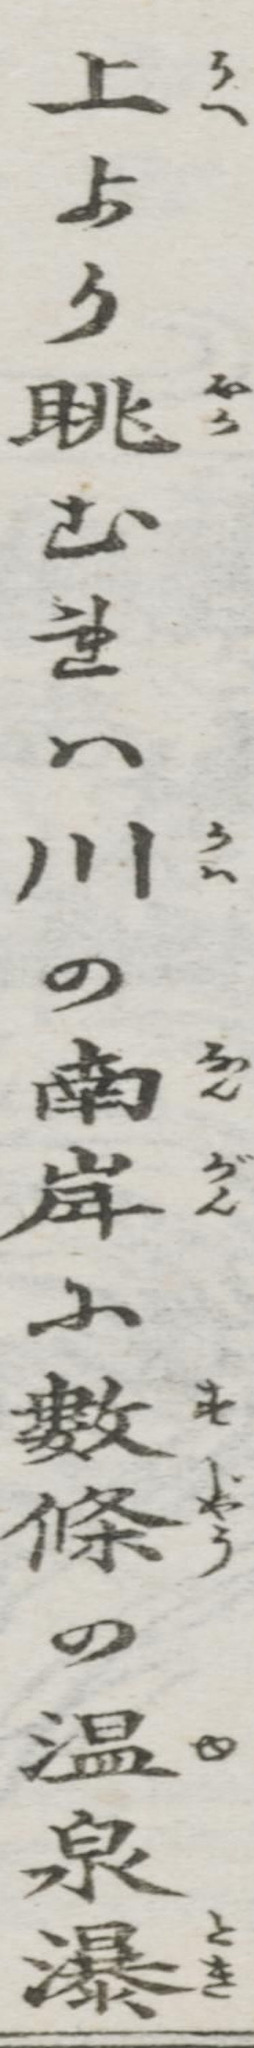上より眺むれは川の南岸に数條の温泉瀑
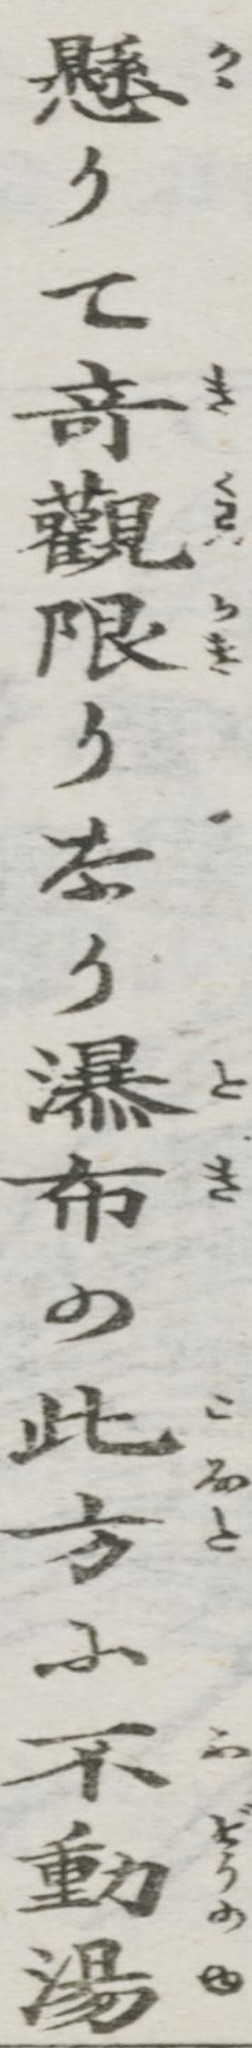懸りて奇観限りなり瀑布の此方に不動湯
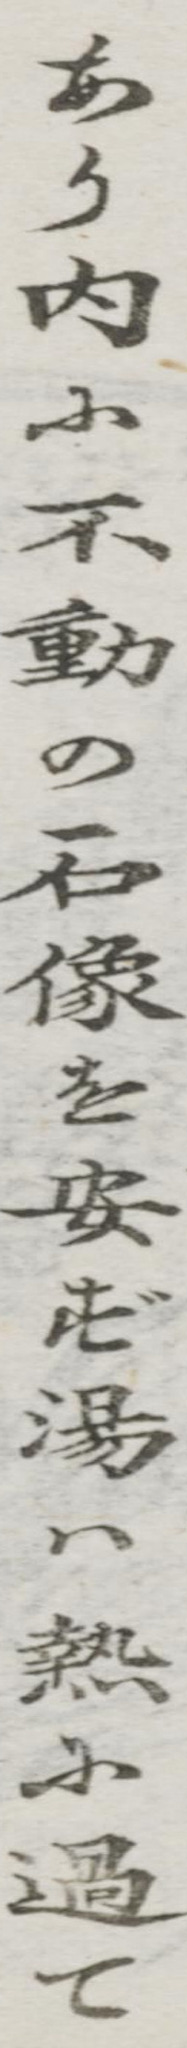あり内に不動の石像を安ず湯は熱に過て
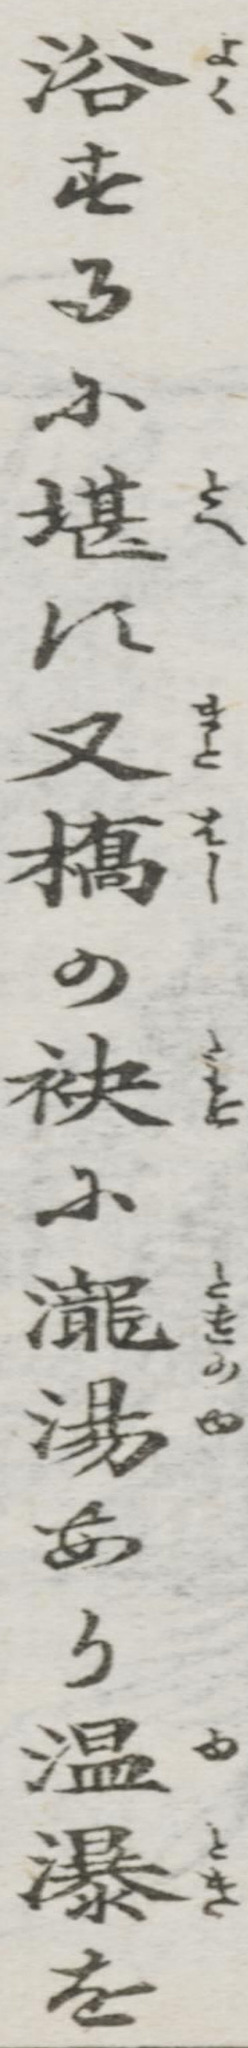浴するに堪す又橋の袂に瀧湯あり温瀑を
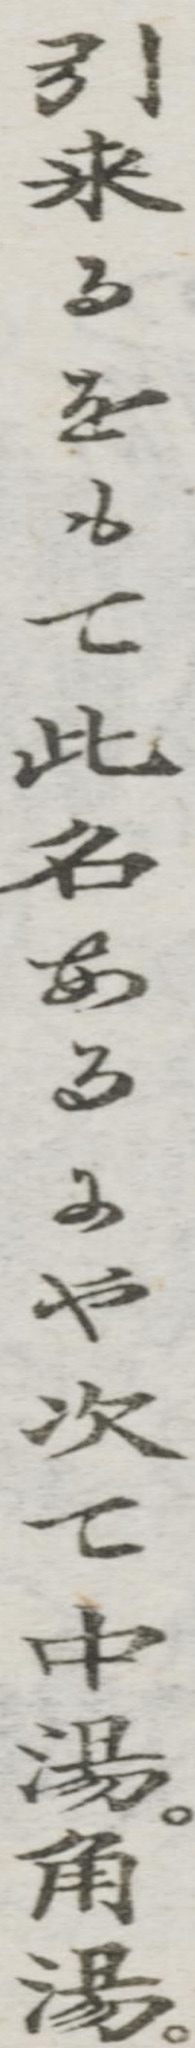引来るをもて此名あるにや次て中湯。角湯。
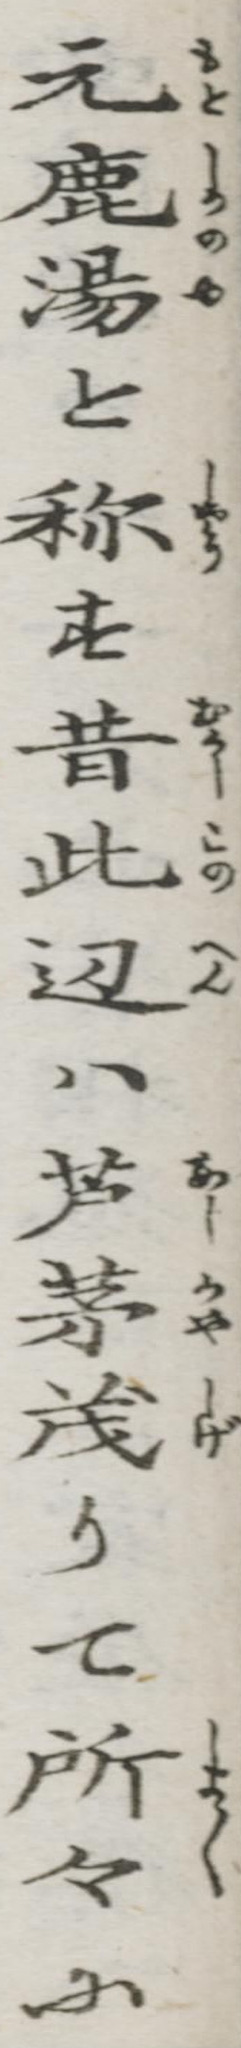元鹿湯と称す昔此辺は芦茅茂りて所々に
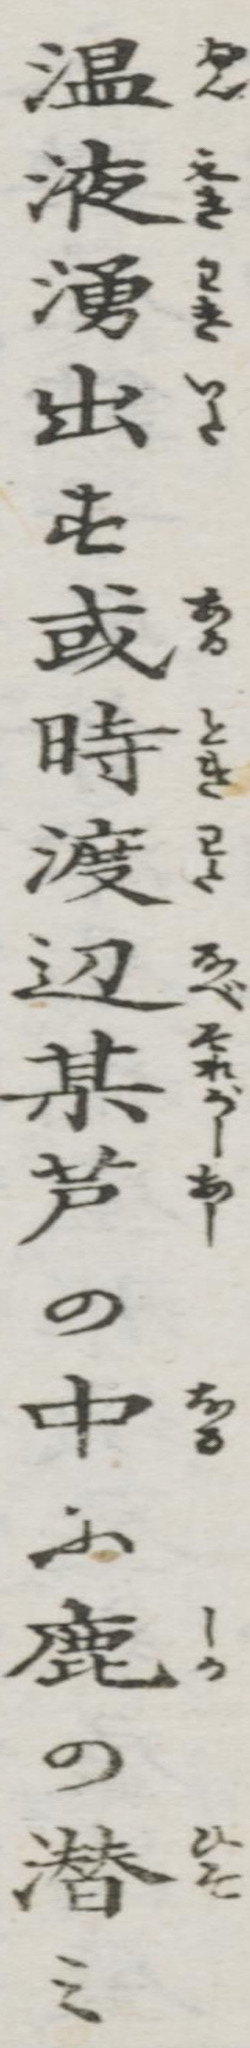温液湧出す或時渡辺某芦の中に鹿の潜み
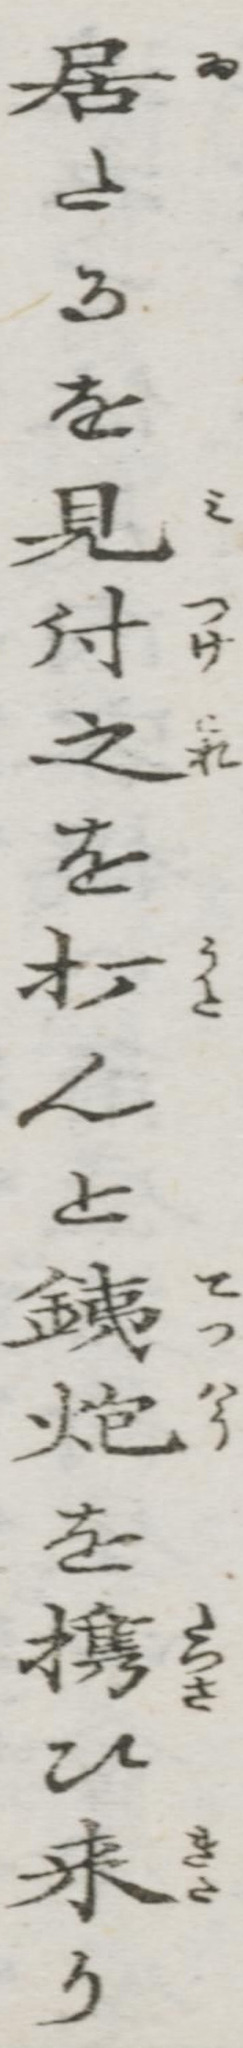居たるを見付之を打んと銕炮を携ひ来り
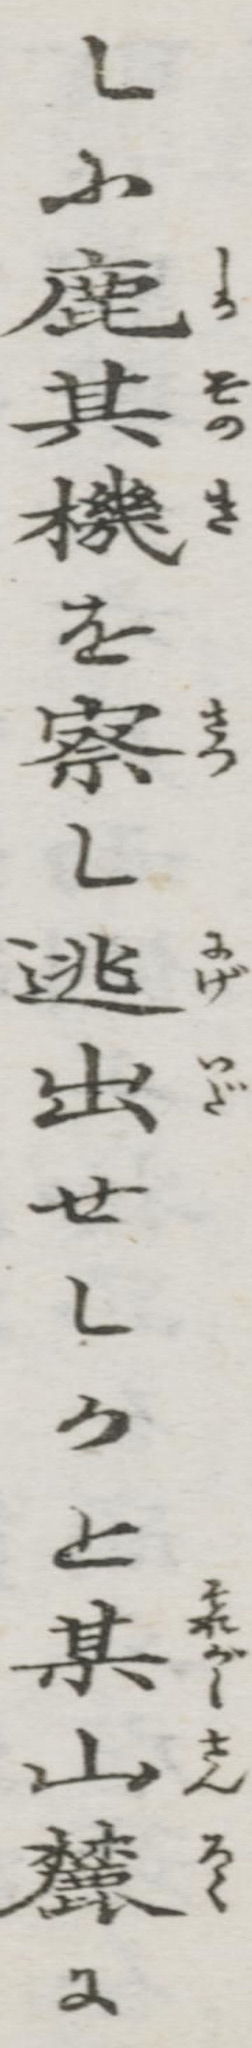しに鹿其機を察し逃出せしかと某山麓に
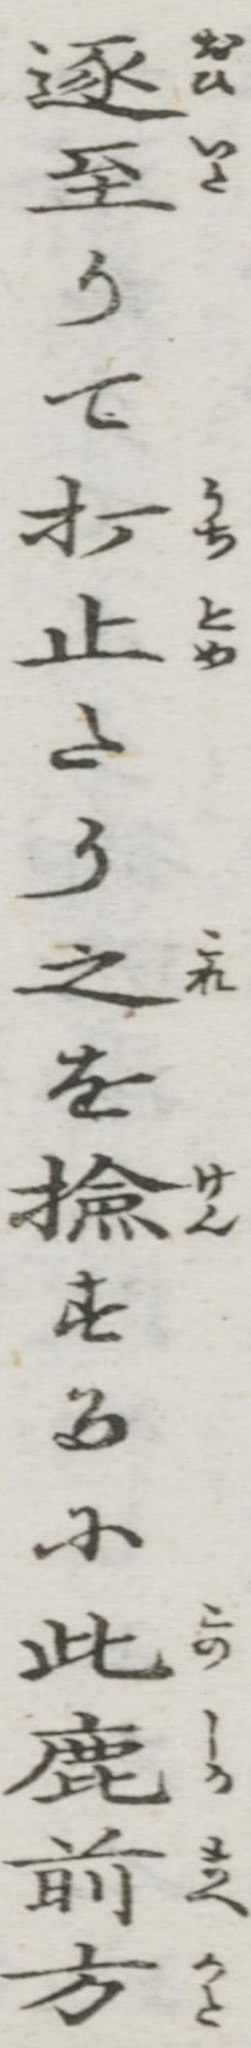逐至りて打止たり之を撿するに此鹿前方
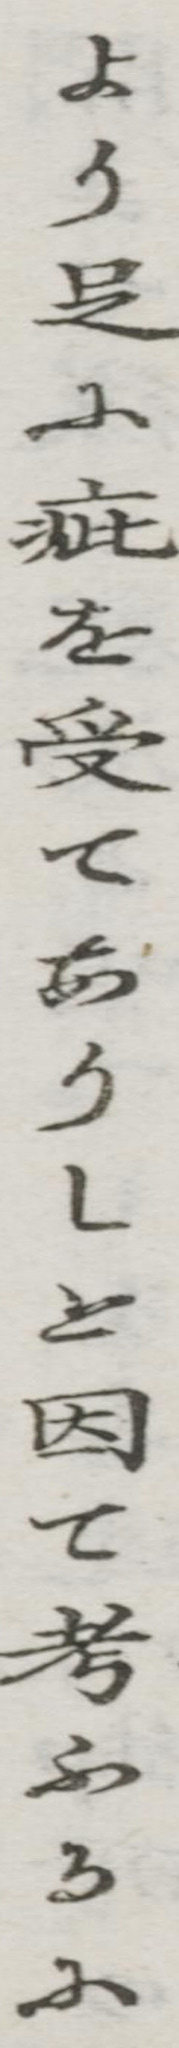より足に疵を受てありしと因て考ふるに
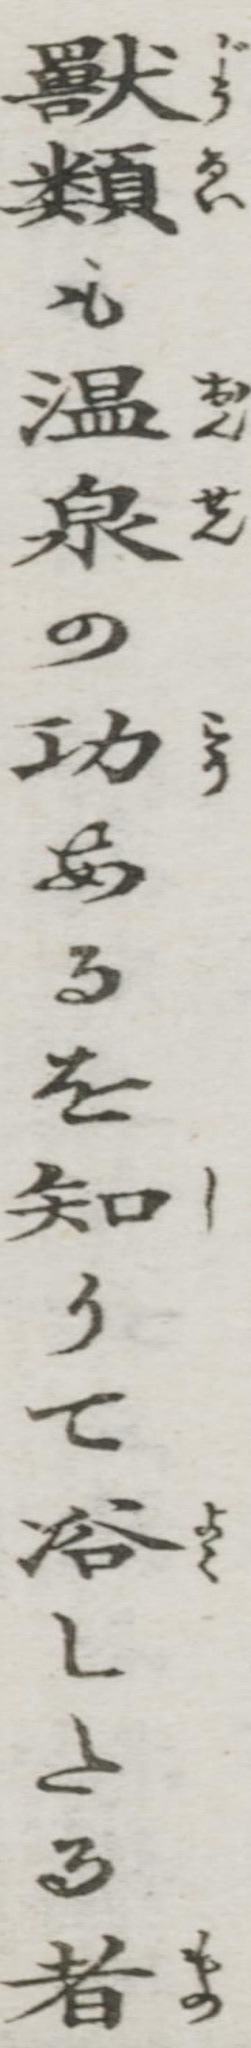獣類も温泉の功あるを知りて浴したる者
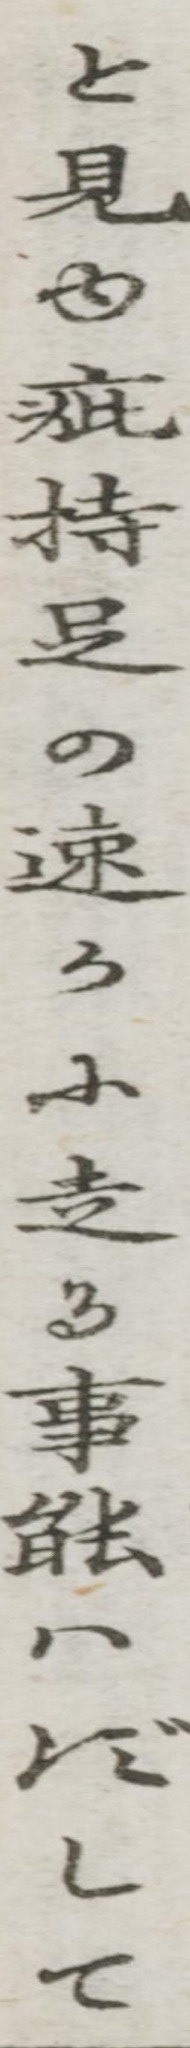と見ゆ疵持足の速かに走る事能はずして

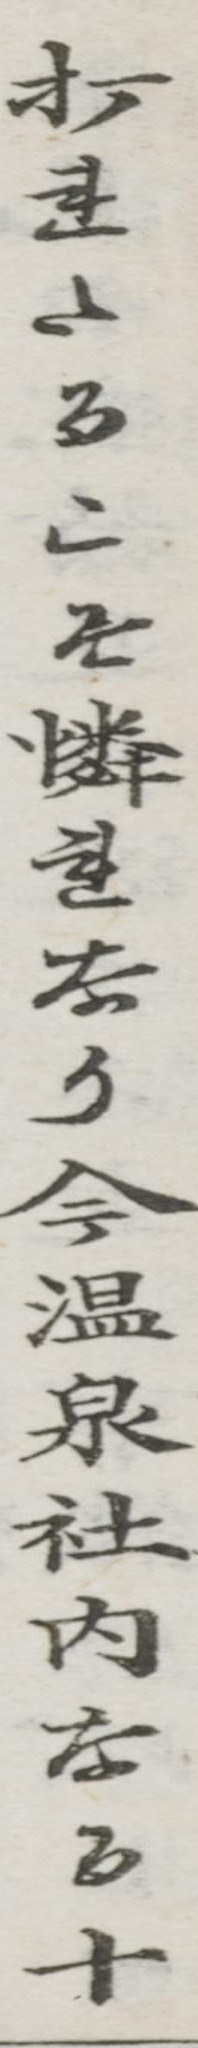打れたるこそ憐れなり今温泉社内なる十
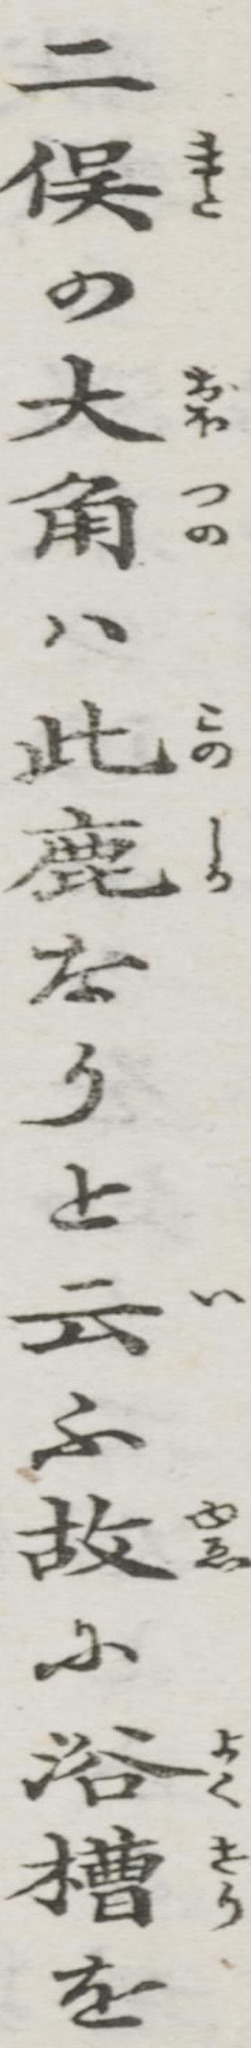二俣の大角は此鹿なりと云ふ浴槽を
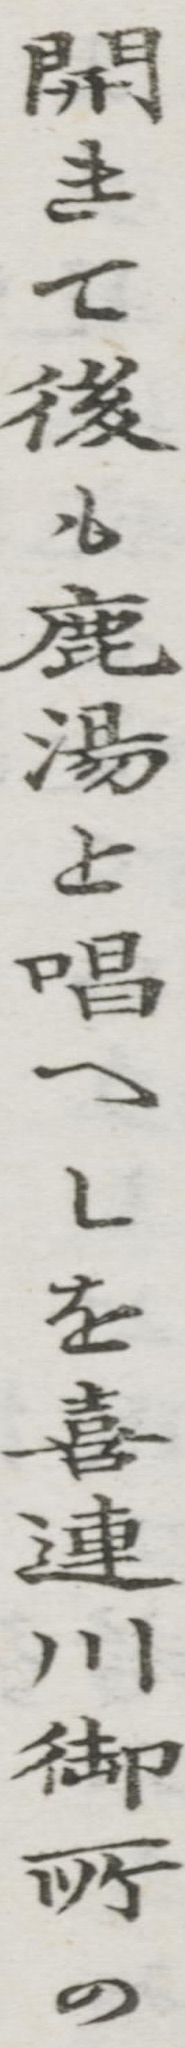開きて後も鹿湯と唱へしを喜連川御所の
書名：塩原繁昌記　全
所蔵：東京大学地震研究所図書室 Earthquake Research Institute Library, The University of Tokyo, JAPAN
